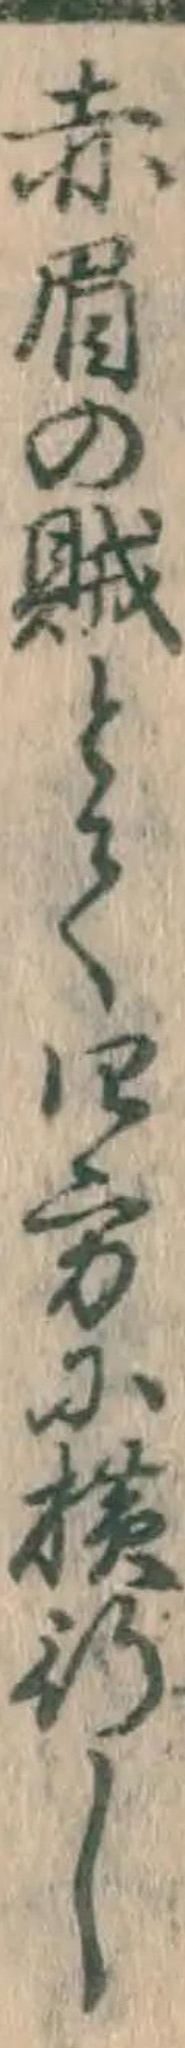赤眉の賊とて四方に横行し
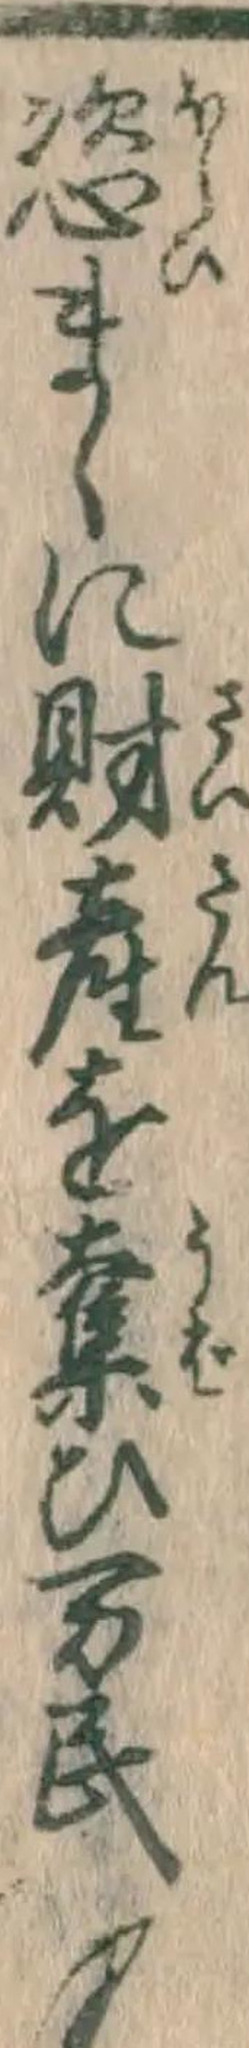恣まゝに財産を奪ひ万民
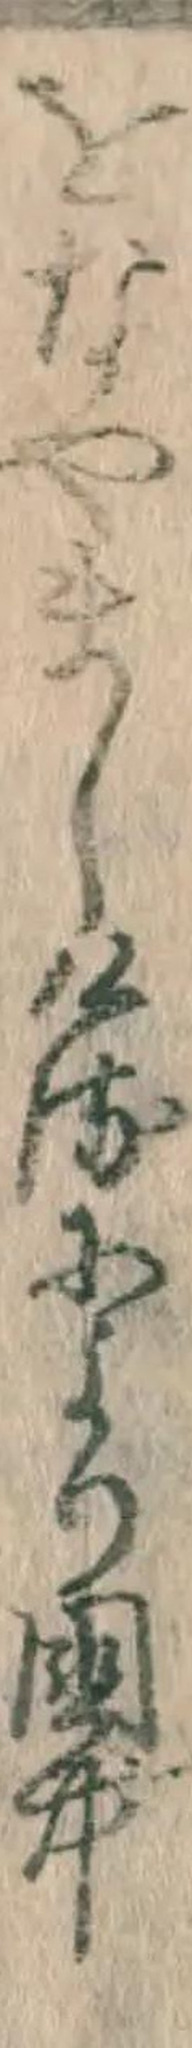をなやましけるにより国中
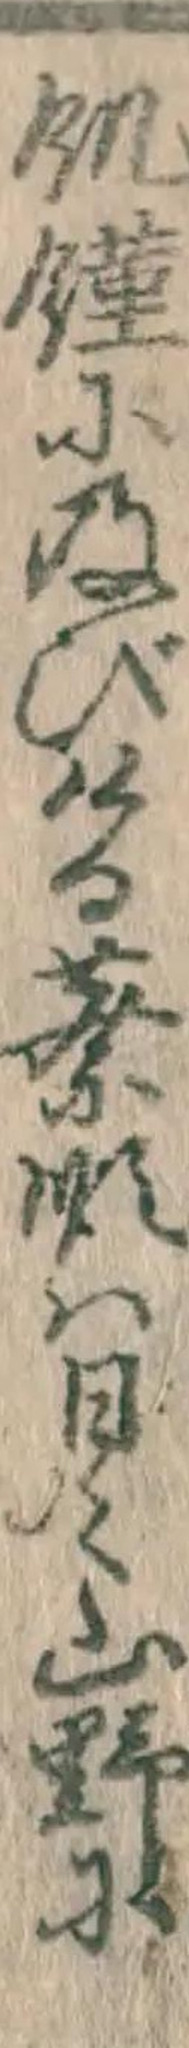飢饉に及びける蔡順は日々山野に
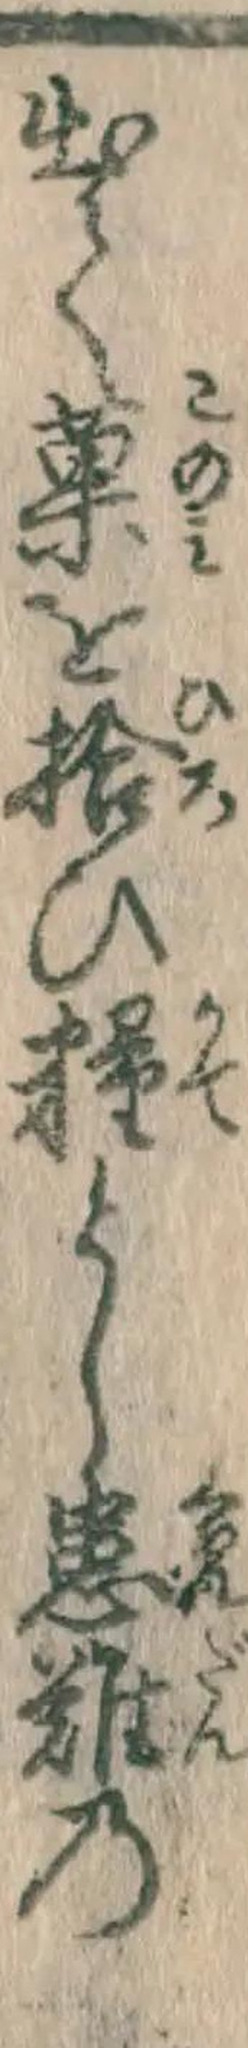出て菓を拾ひ糧とし患難の
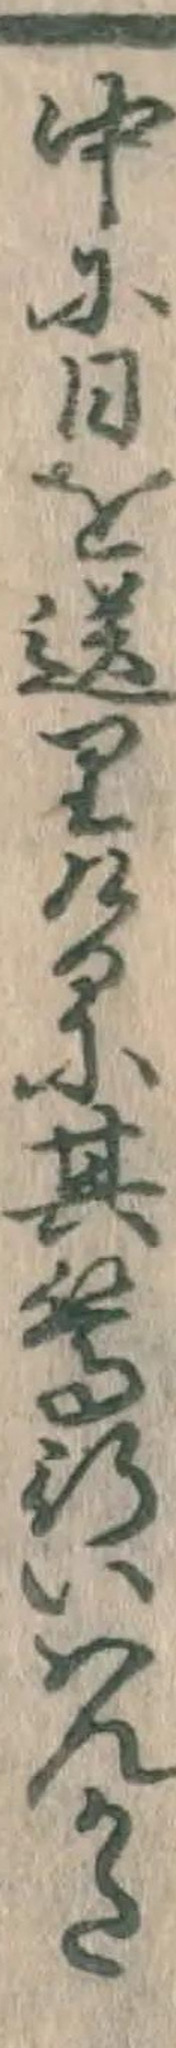中に日を送りけるに其篤行いはんかた
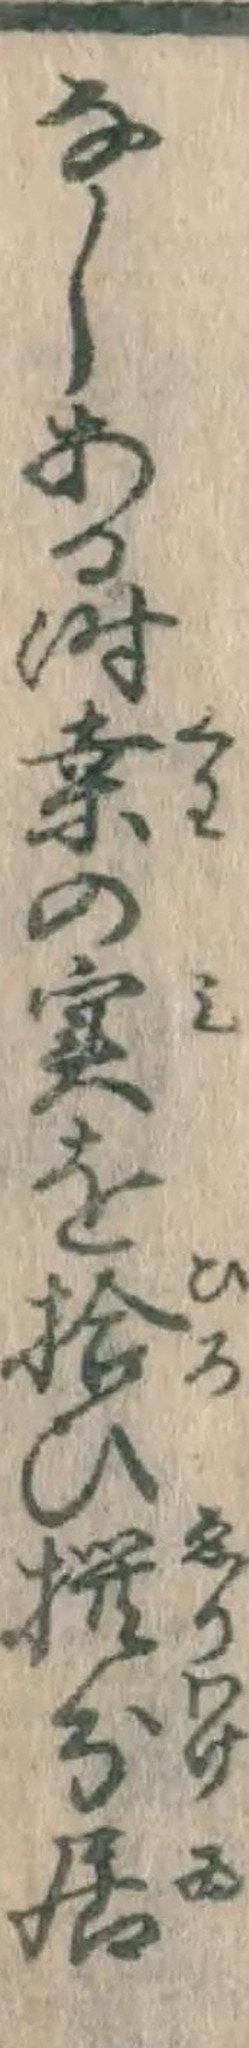なしある時桑の実を拾ひ撰分居
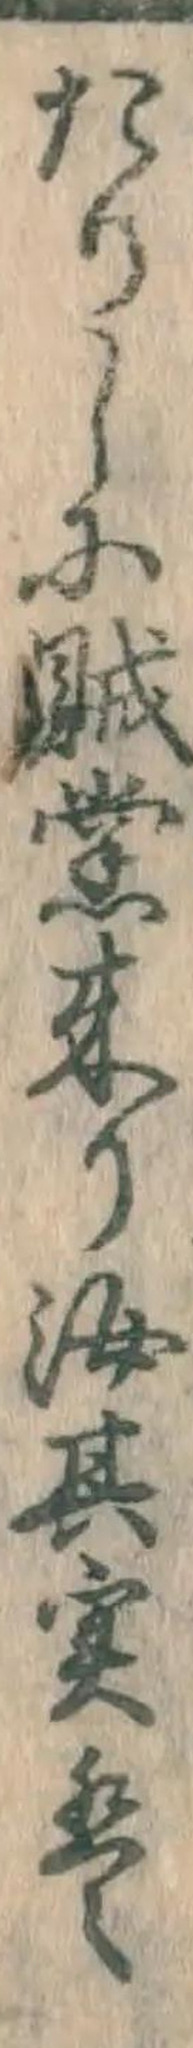たりしに賊党来り汝其実は

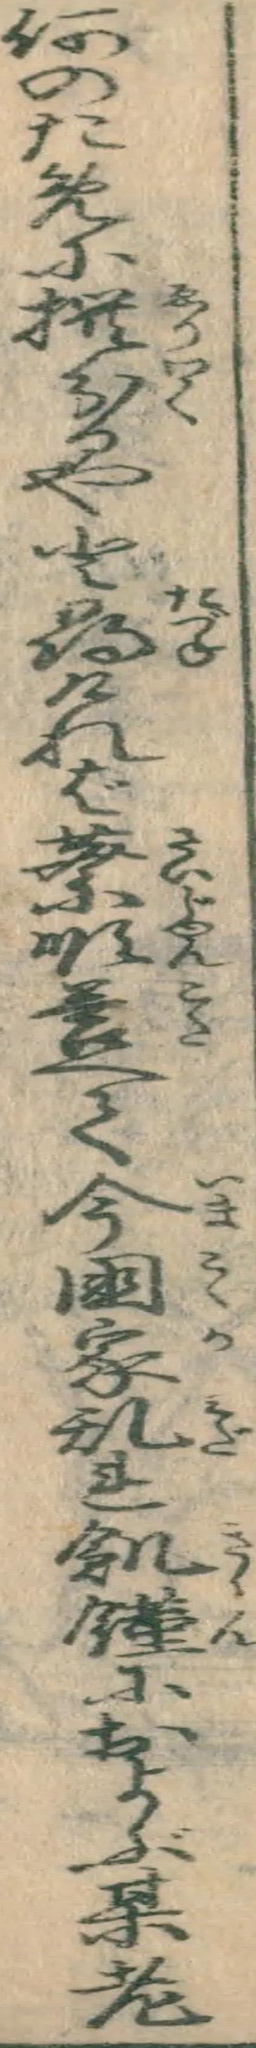何のために撰分るやと尋ければ蔡順答へて今国家乱れ飢饉におよぶ某老
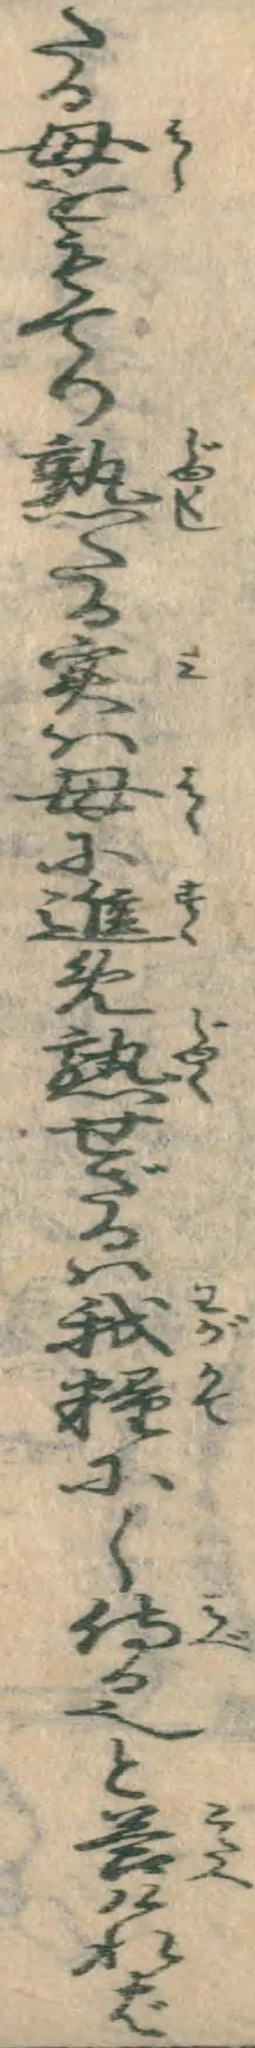たる母をもてり熟たる実は母に進め熟せざるは我糧にし侍る也と答ければ
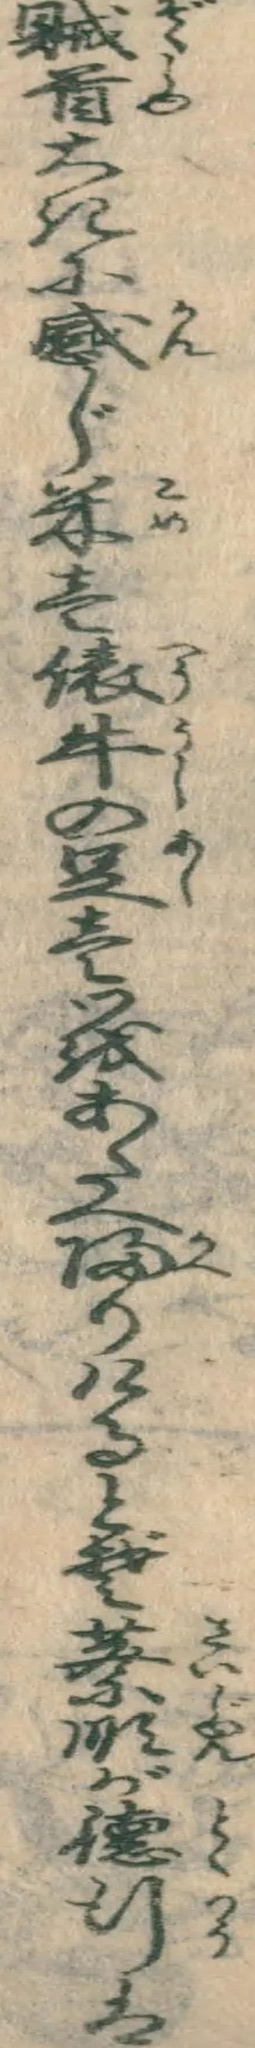賊首大きに感じ米壱俵牛の足壱ツをあたへ帰りけるとぞ蔡順が徳行は
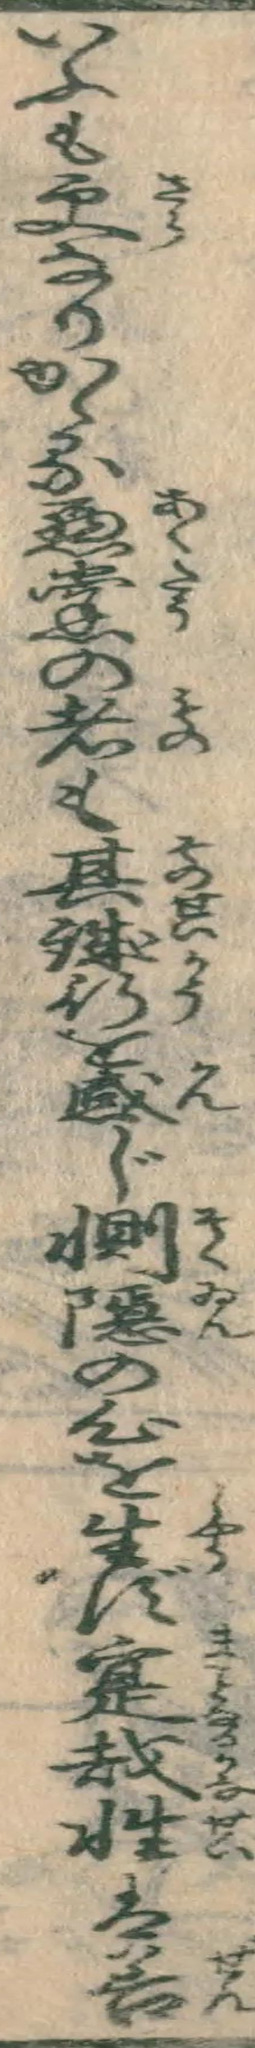いふも更なりかゝる悪党の者も其誠行を感じ惻隠の心を生ず寔哉性は善
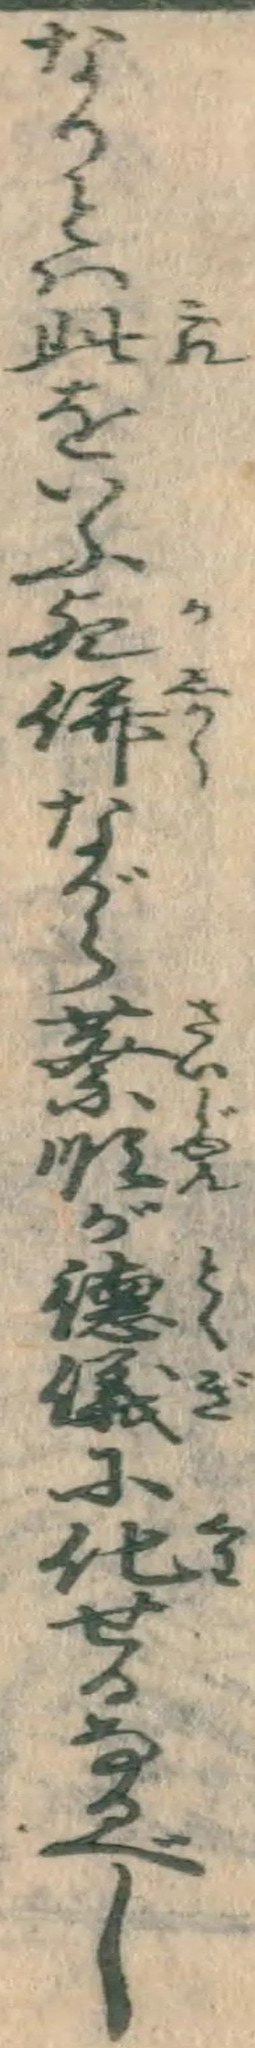なりとは此をいふ歟併ながら蔡順が徳儀に化せるなるべし
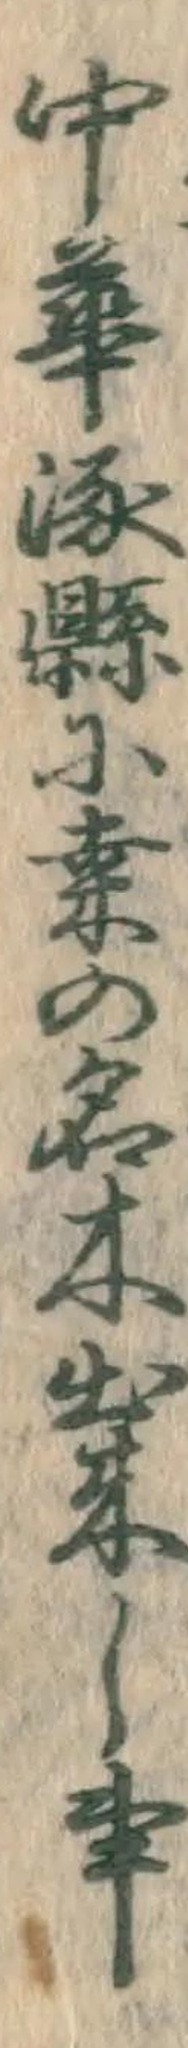中華涿県に桑の名木出来し事
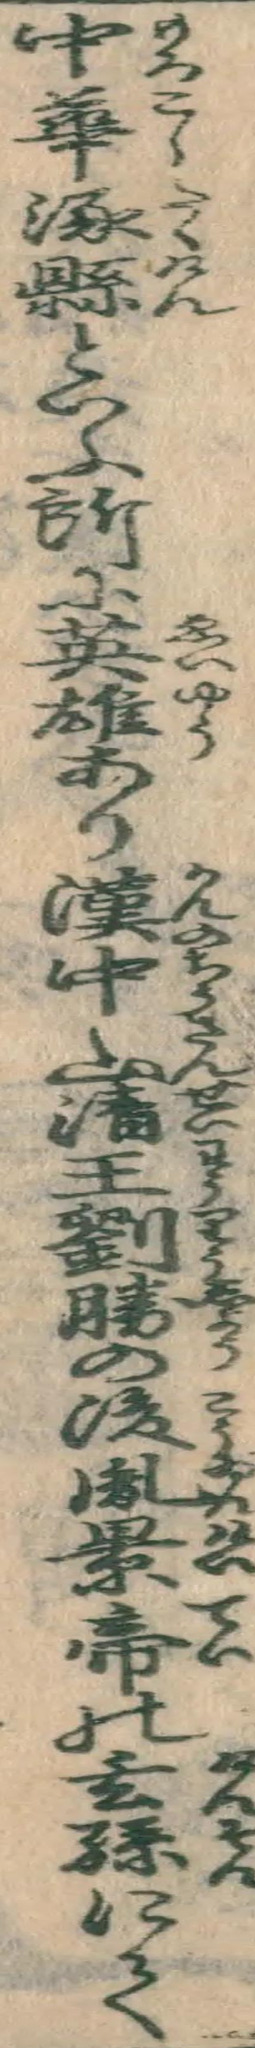中華琢県といふ所に英雄あり漢中山清王劉勝の後胤景帝の玄孫にて
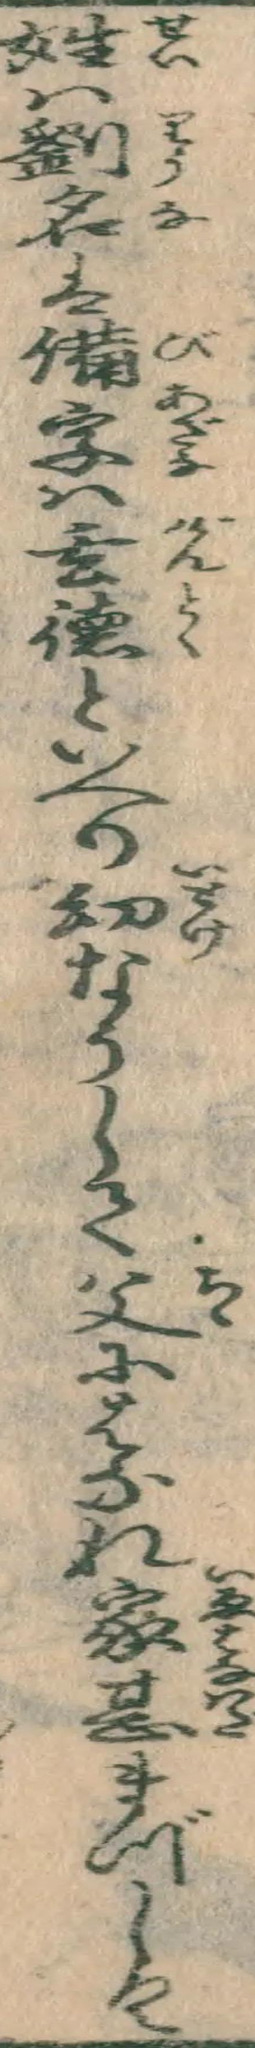姓は劉名は備字は玄徳といへり幼なうして父にはなれ家甚まづしく
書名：養蚕秘録 3巻. [3]
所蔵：国立国会図書館 National Diet Library, JAPAN
